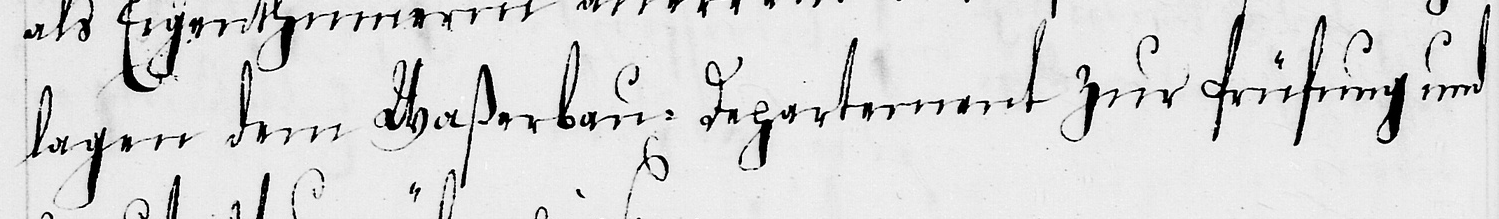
lagen dem Waßerbau-Departement zur Prüfung und
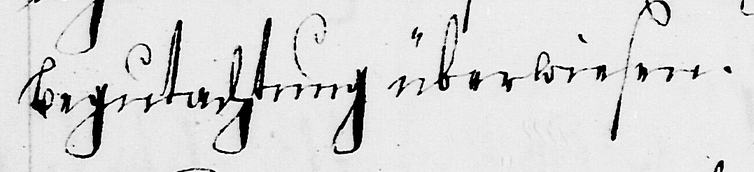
Begutachtung überwiesen.
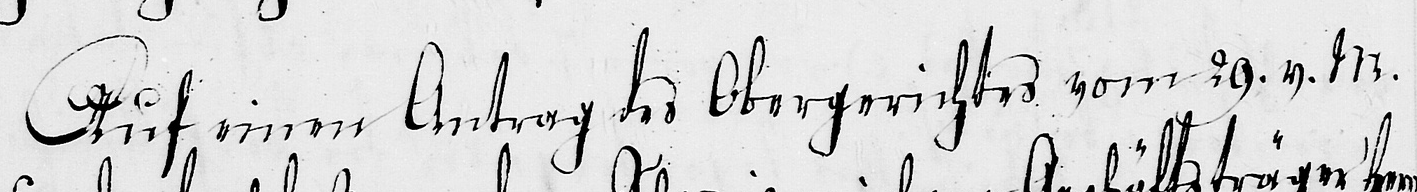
Auf einen Antrag des Obergerichtes vom 29. v. M.
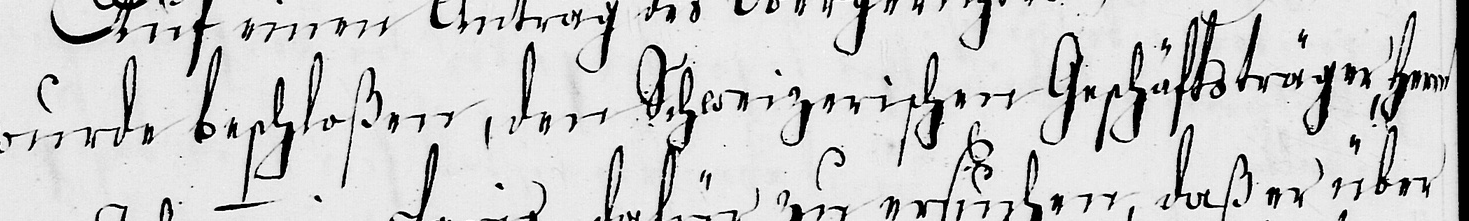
wurde beschloßen, den Schweizerischen Geschäftsträger Her¬
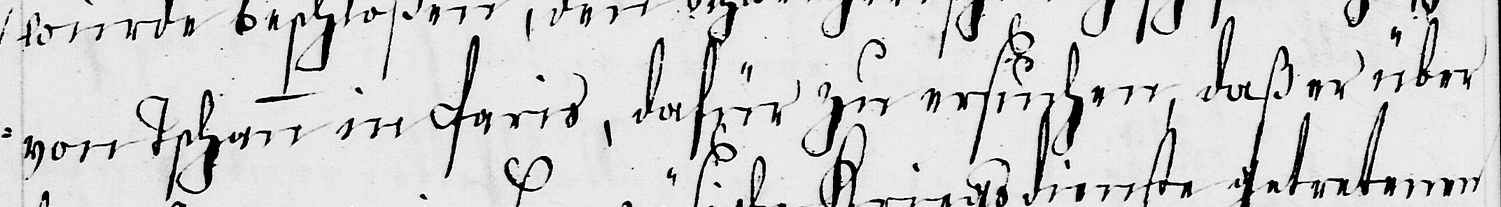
von Tschann in Paris, dafür zu ersuchen, daß er über
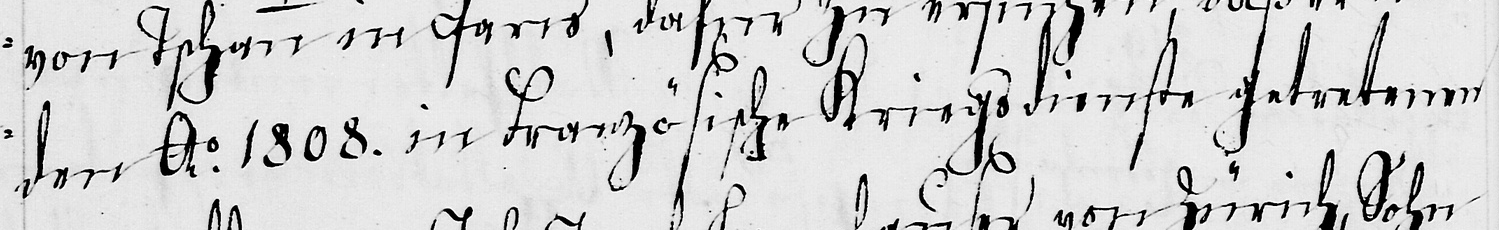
den A°. 1808. in französische Kriegsdienste getretenen
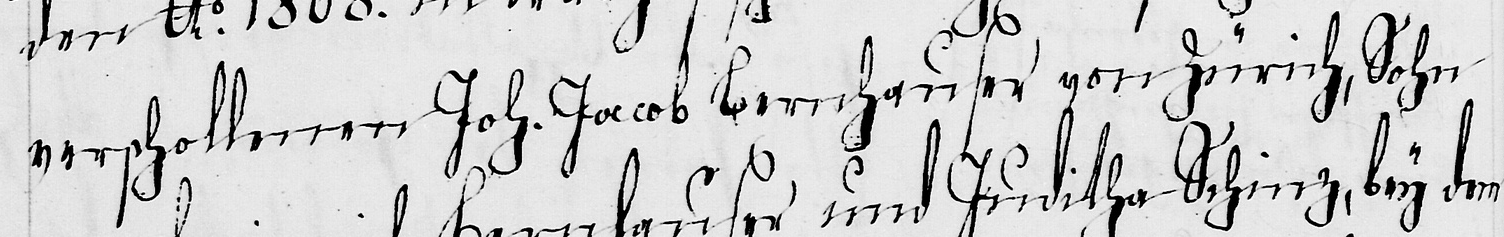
verschollenen Joh. Jacob Bernhauser von Zürich, Sohn
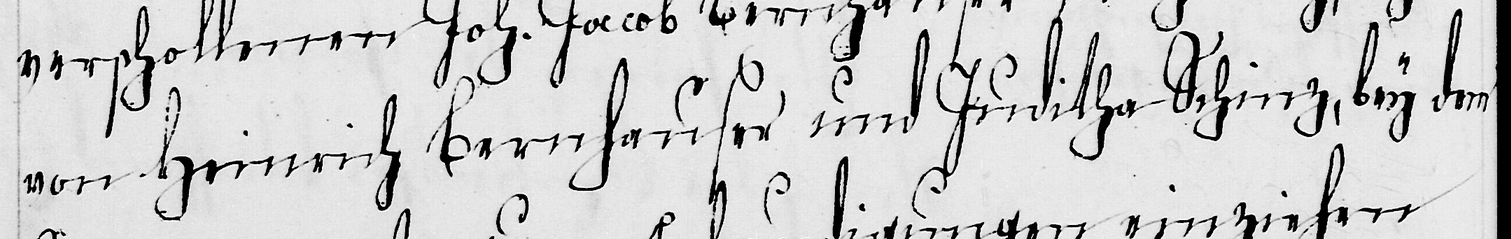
von Heinrich Bernhauser und Juditha Schinz, bey dem
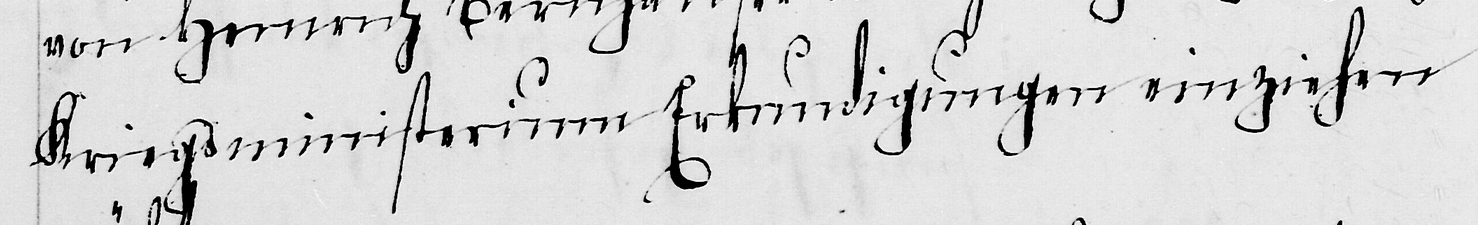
Kriegsministerium Erkundigungen einziehen
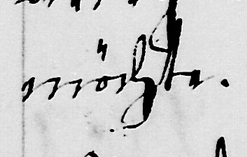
möchte.
